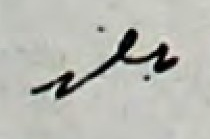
do
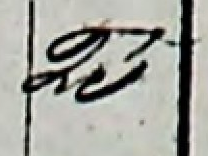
25
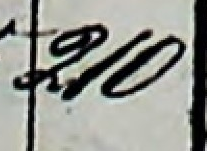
210
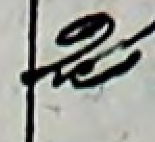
25
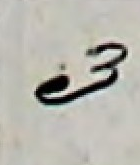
3
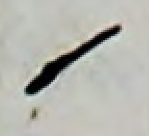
1
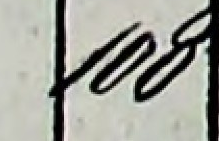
100
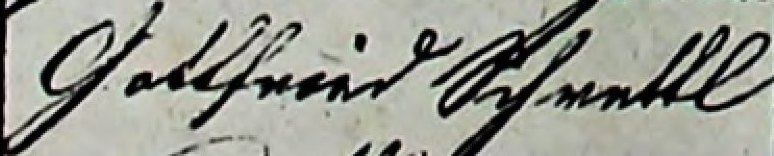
Gottfried Schrettl
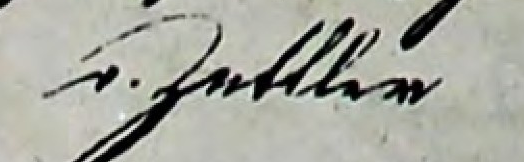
v. Zettler
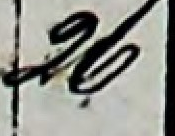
26
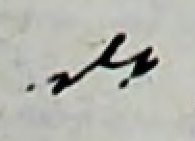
do
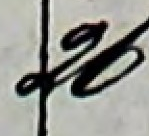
26
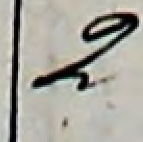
2
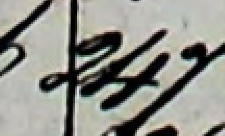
247
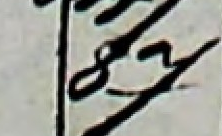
87
